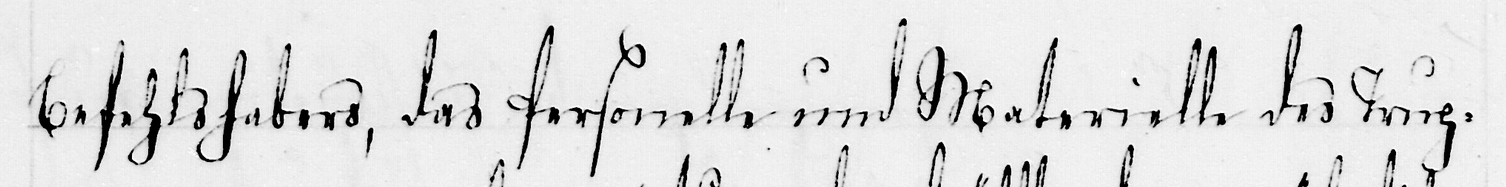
Befehlshabers, das Personelle und Materielle des Trup¬
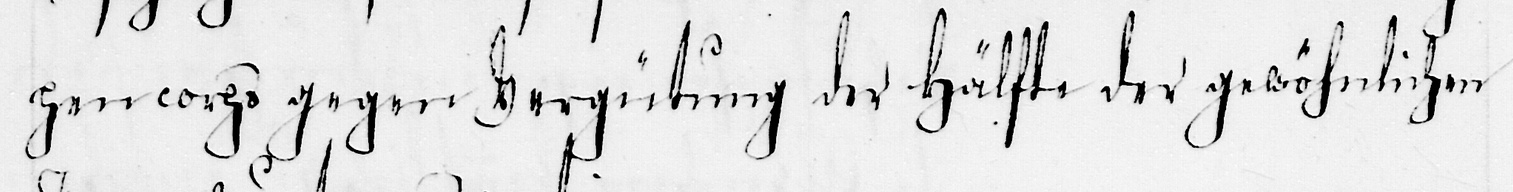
pencorps gegen Vergütung der Hälfte der gewöhnlichen
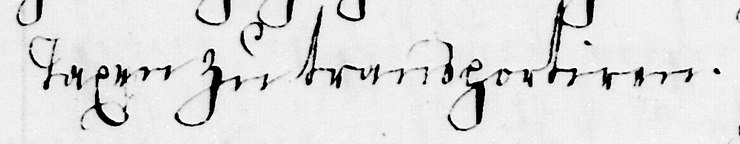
Taxen zu transportiren.
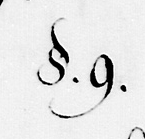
§. 9.
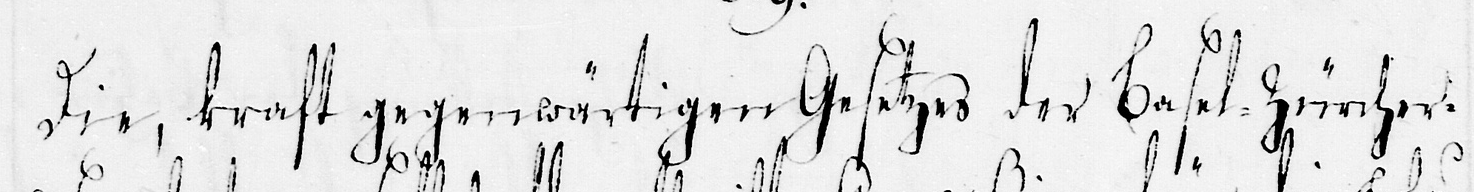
Die, kraft gegenwärtigen Gesetzes der Basel-Zürche¬
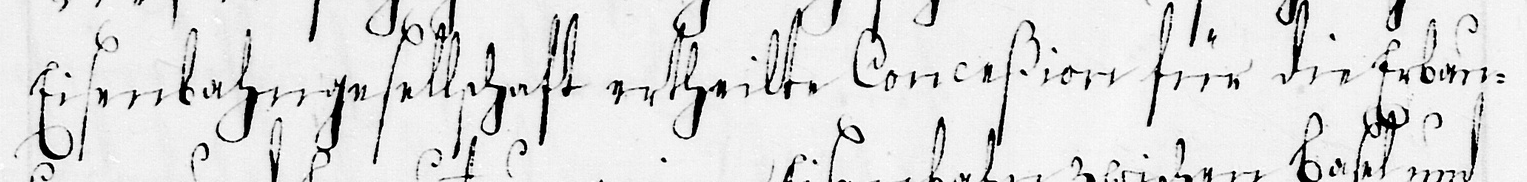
isenbahngesellschaft ertheilte Conceßion für die Erbau¬
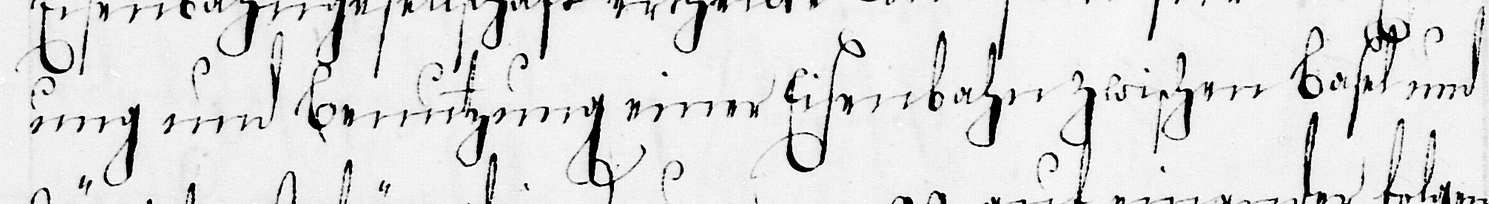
ung und Benutzung einer Eisenbahn zwischen Basel und
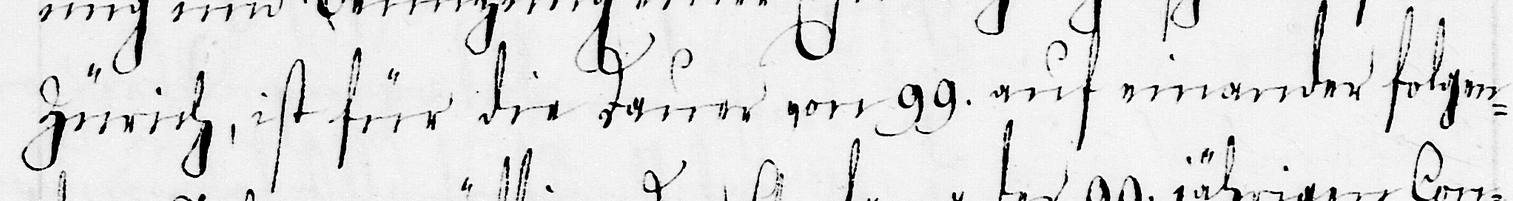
Zürich, ist für die Dauer von 99. auf einander folgen¬
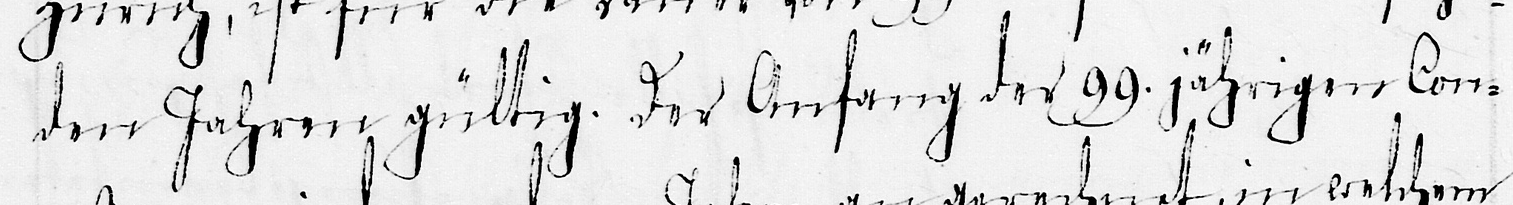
den Jahren gültig. Der Anfang der 99. jährigen Con¬
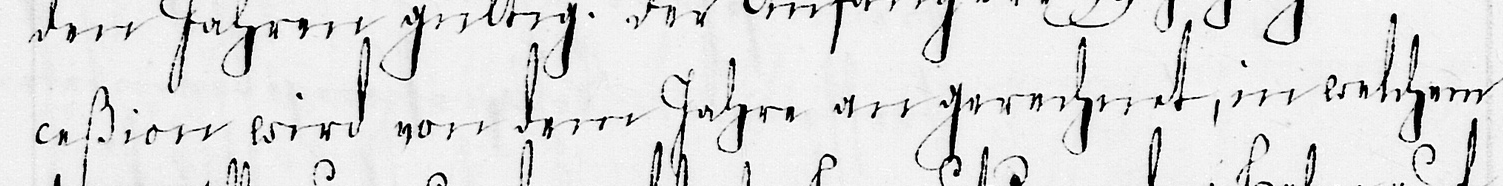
ceßion wird von dem Jahre an gerechnet, in welchem
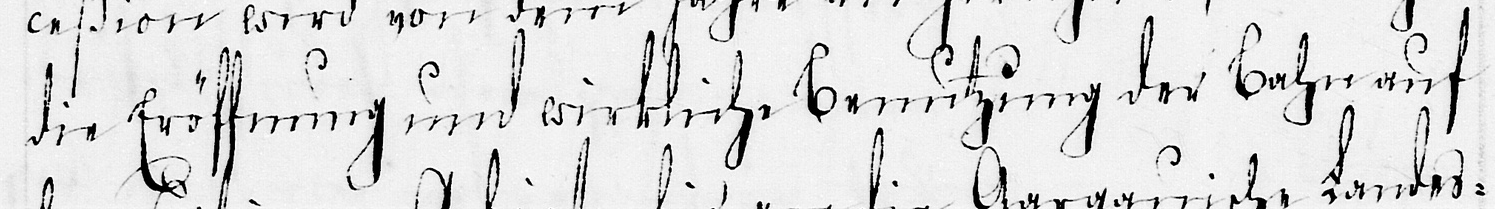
die Eröffnung und wirkliche Benutzung der Bahn auf
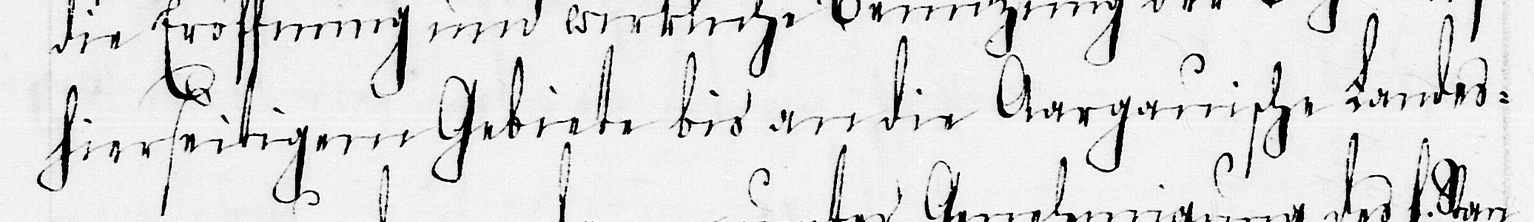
hierseitigem Gebiete bis an die Aargauische Landes¬
